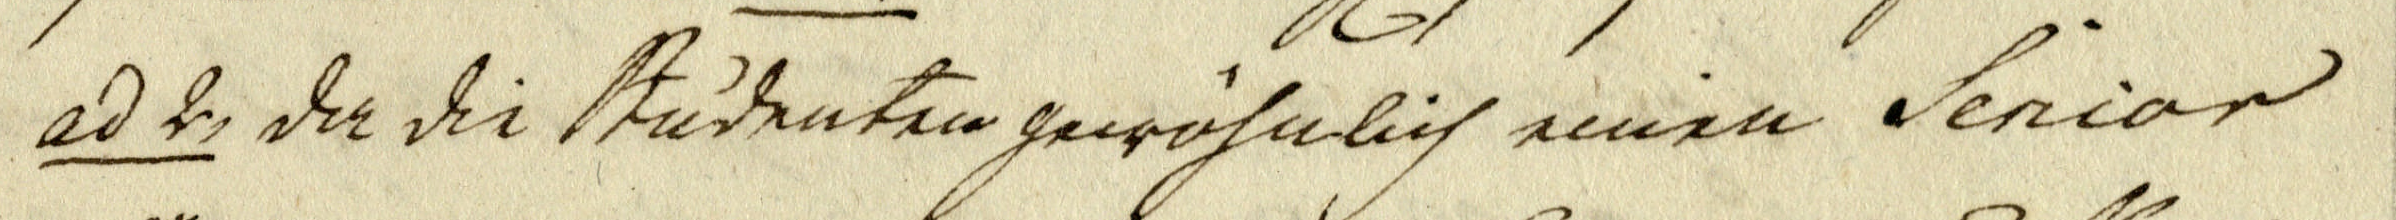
ad 2. Da die Studenten gewöhnlich einen Senior
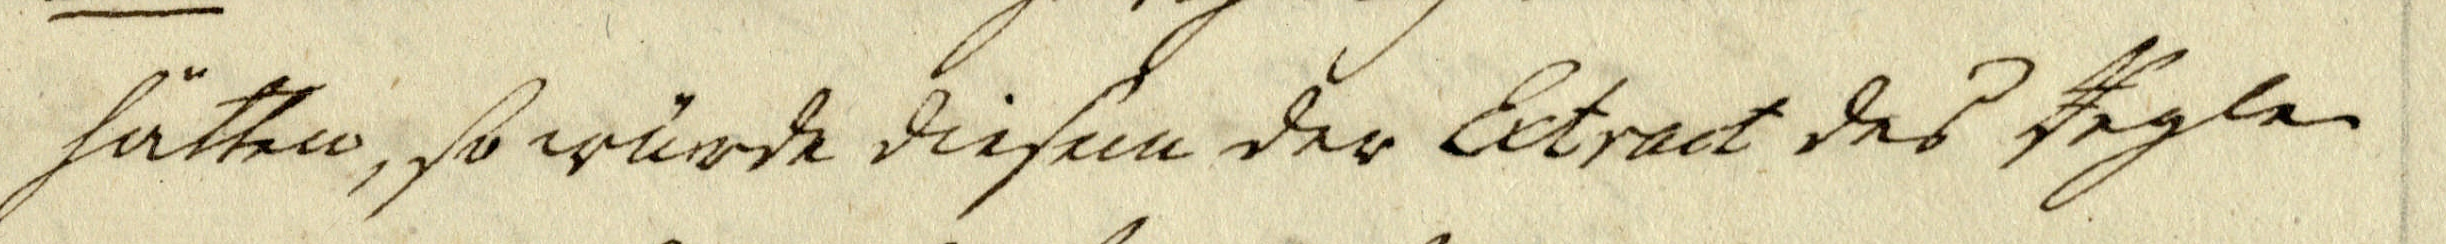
hätten, so würde diesem der Extract des Regle¬
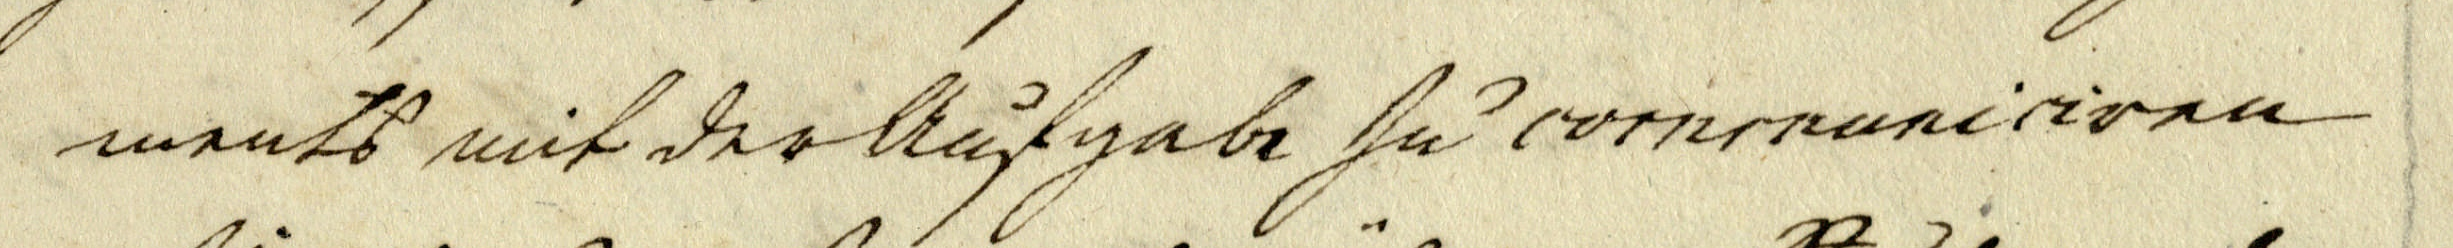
ments mit der Aufgabe zu communiciren
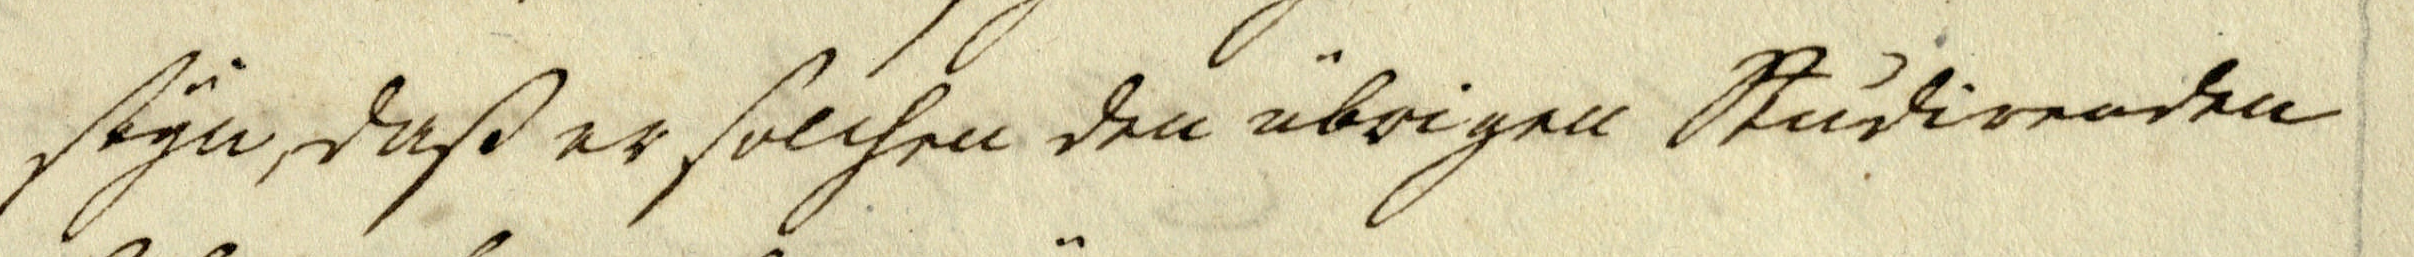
seÿn, daß er solchen den übrigen Studirenden
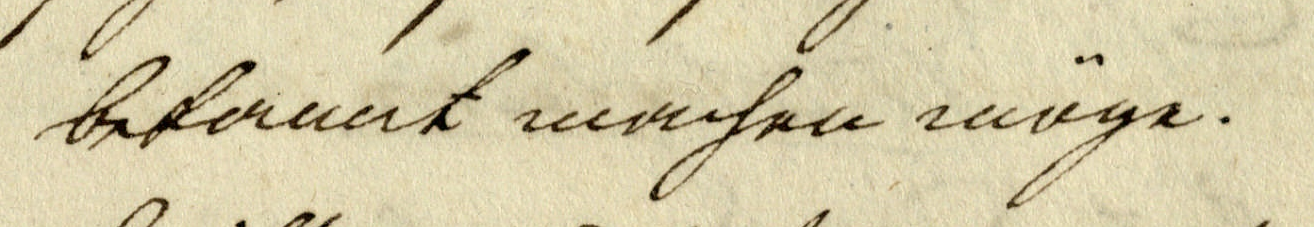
bekannt machen möge.
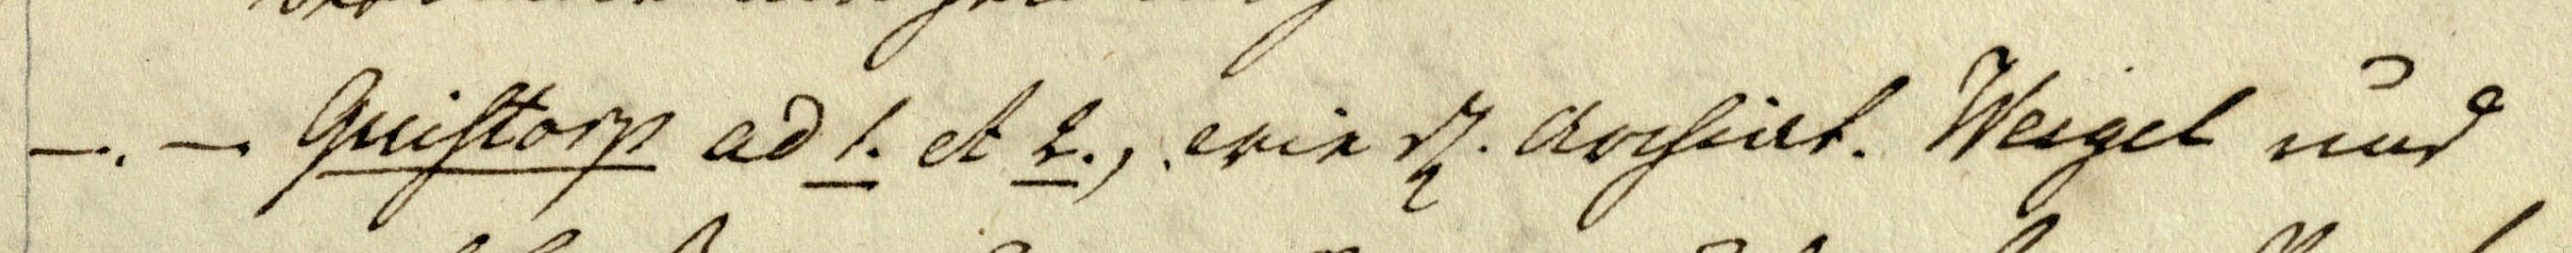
Quistorp ad 1. et 2., wie dh. Archiat. Weigel und
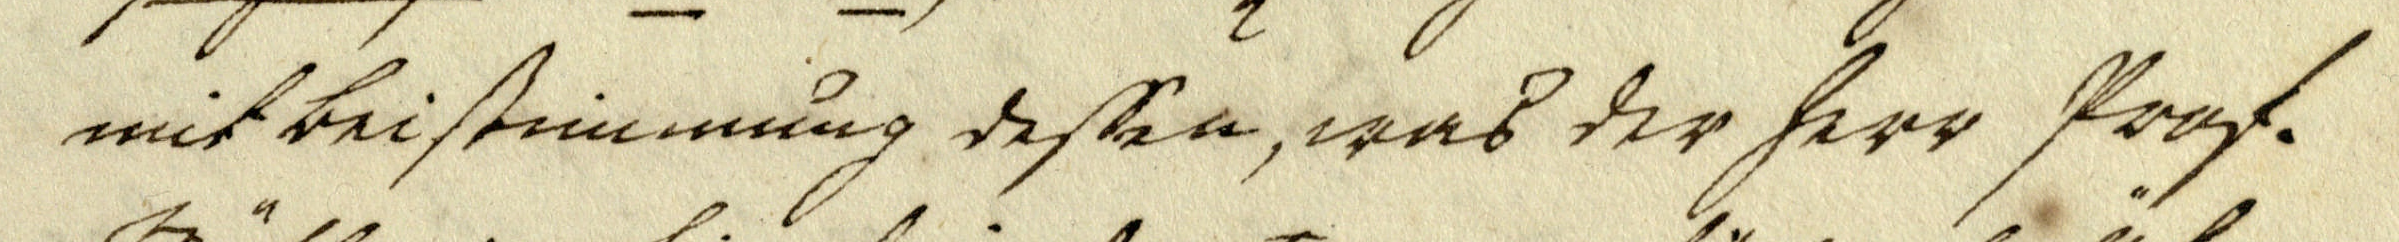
mit Beistimmung dessen, was der Herr Prof.
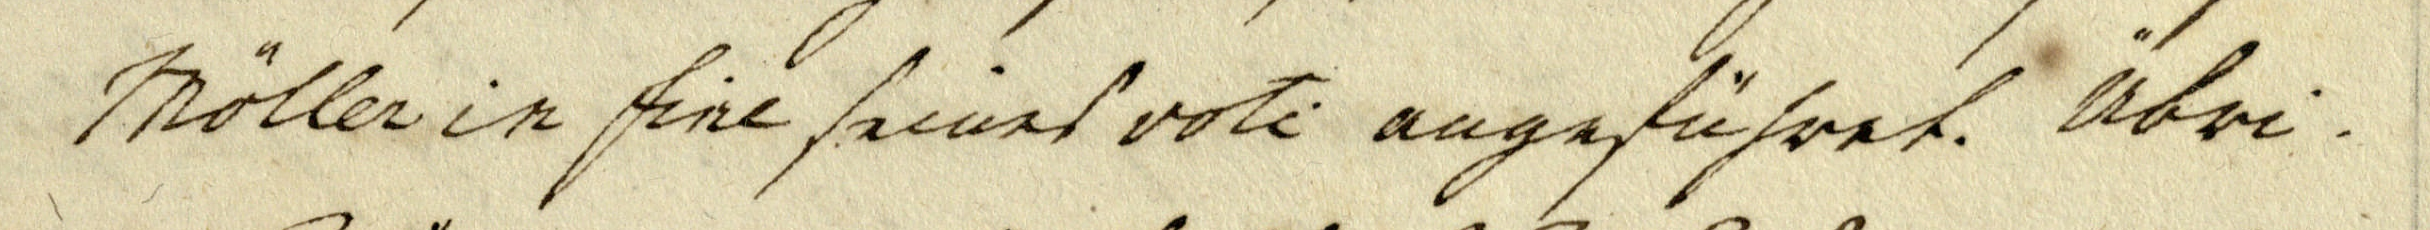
Möller in fine seines voti angeführet. Übri¬
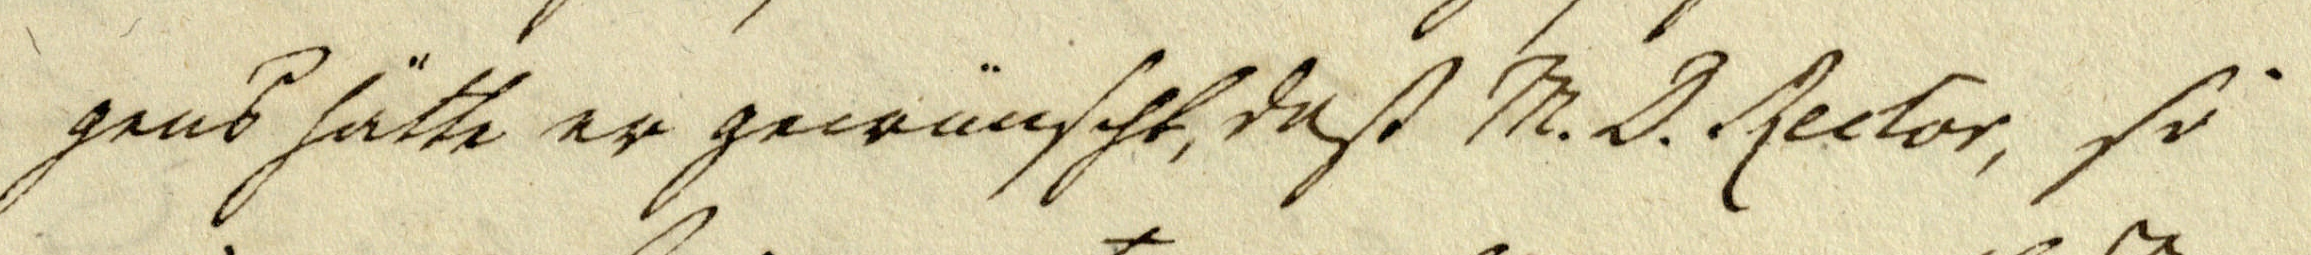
gens hätte er gewünscht, daß M. D. Rector, so
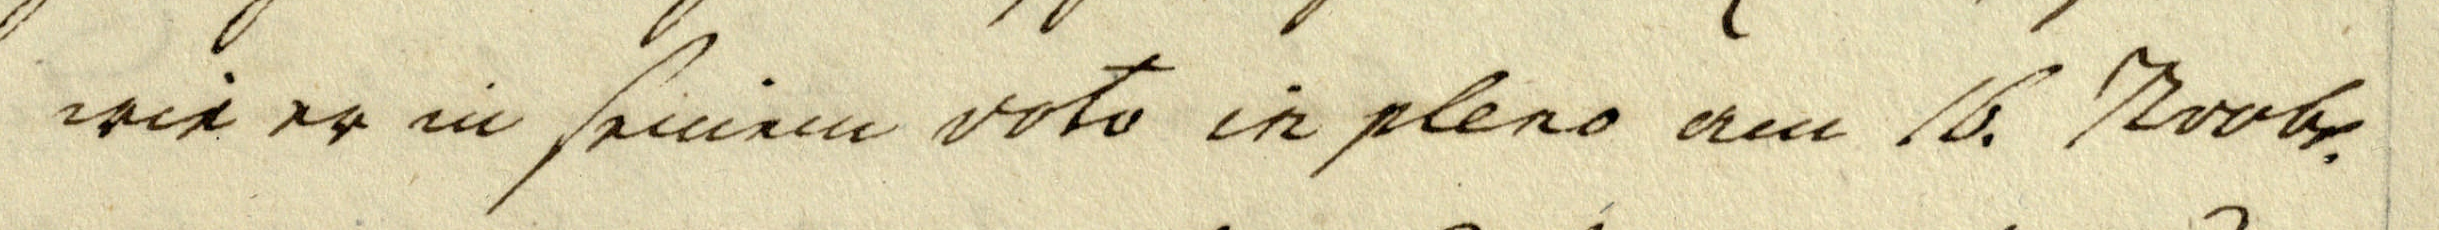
wie er in seinem voto in pleno am 18. Novbr.
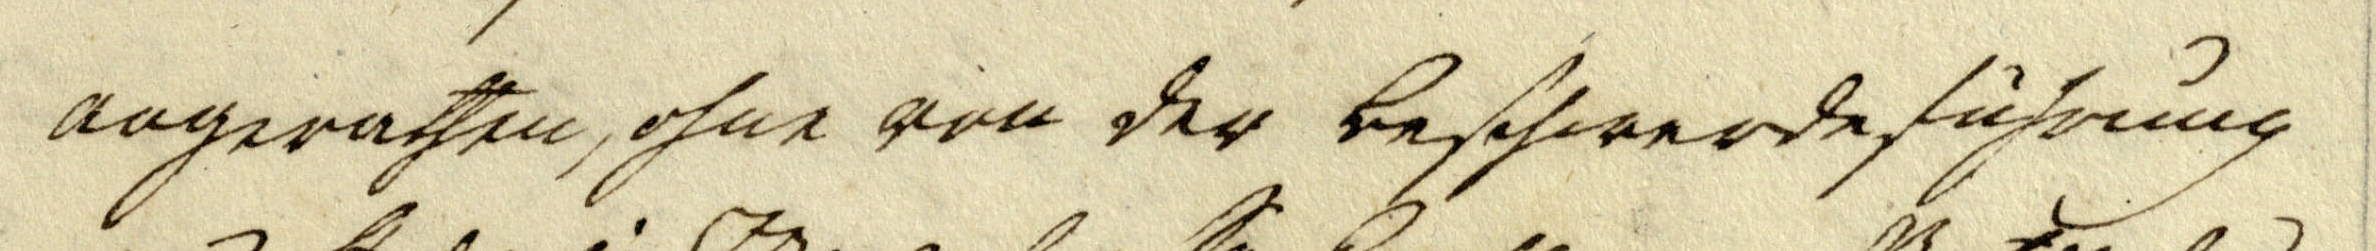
angerathen, ohne von der Beschwerdeführung
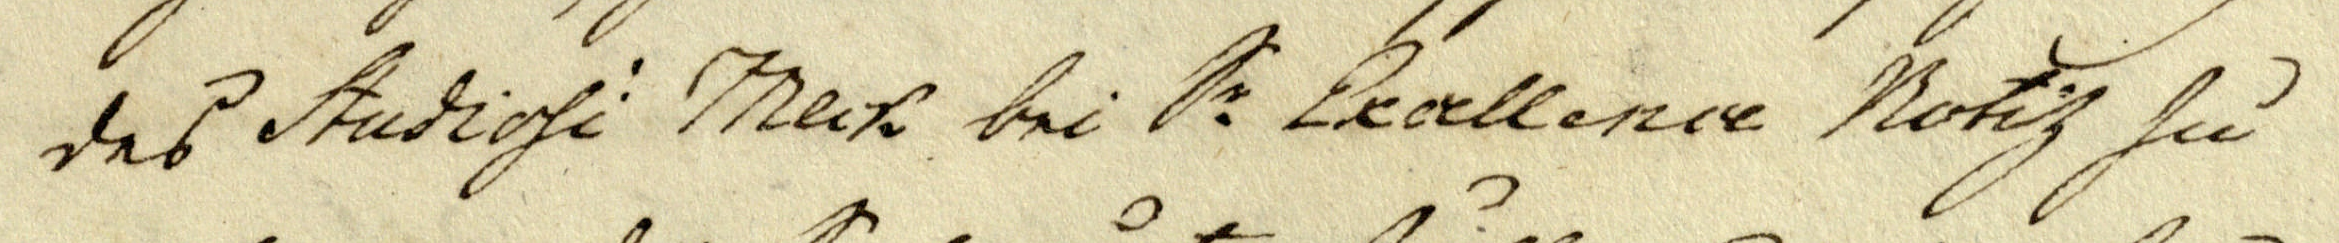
des Studiosi Meck bei Sr Excellence Notiz zu
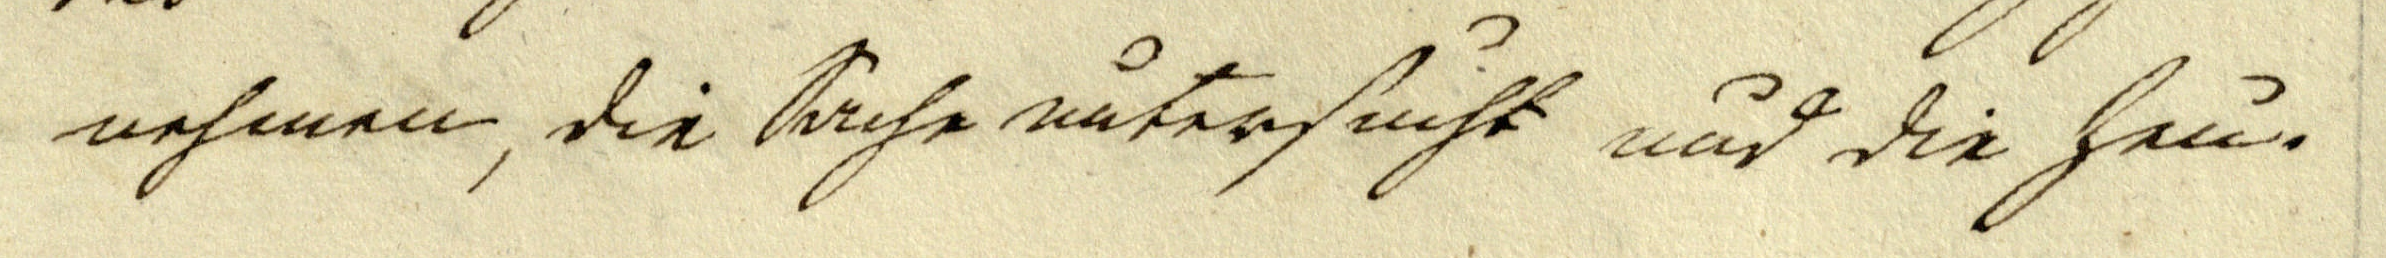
nehmen, die Sache untersucht und die Zeu¬
